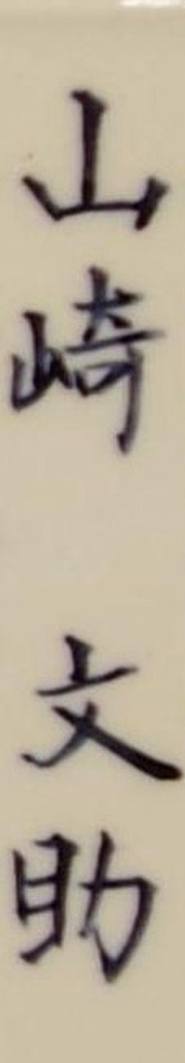山崎文助
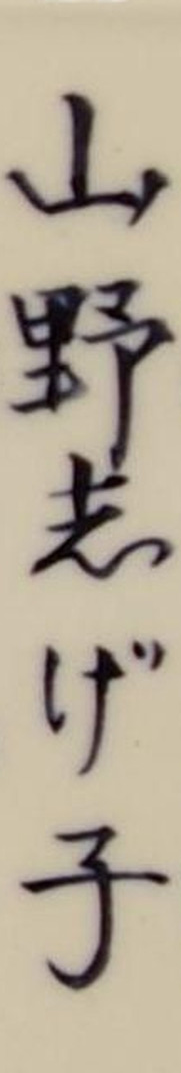山野しげ子
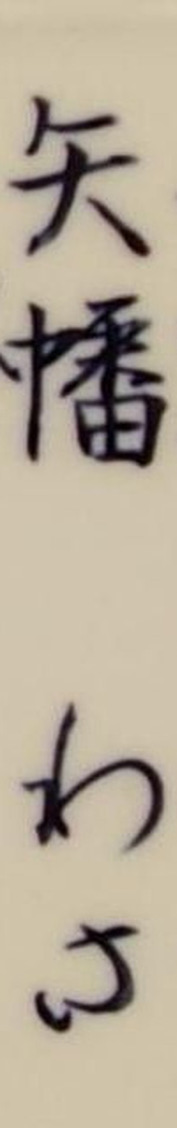矢幡わさ
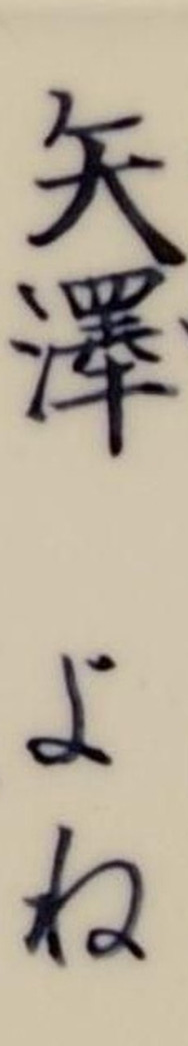矢澤よね
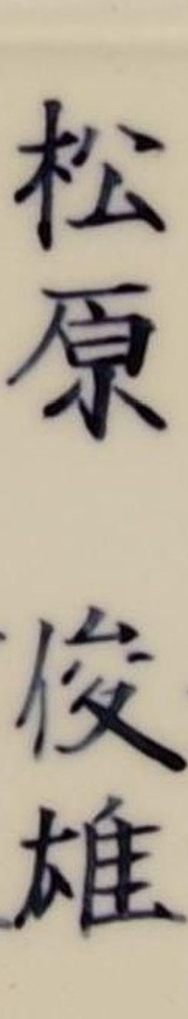松原俊雄
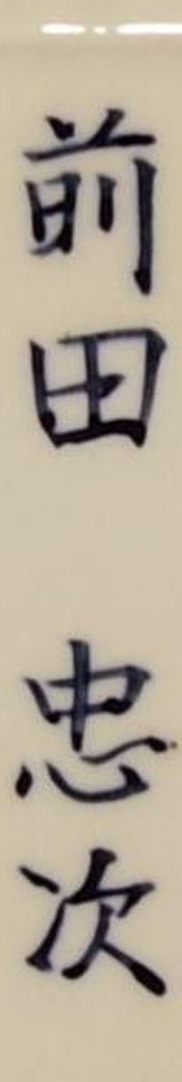前田忠次
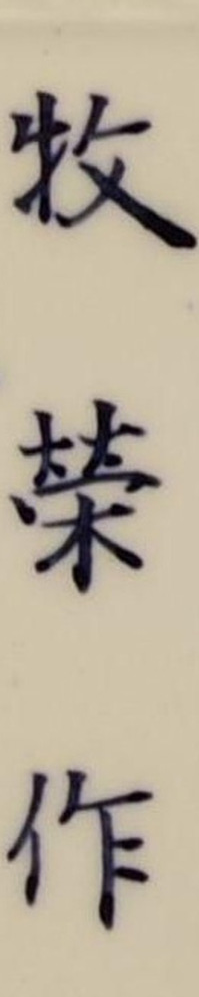牧榮作
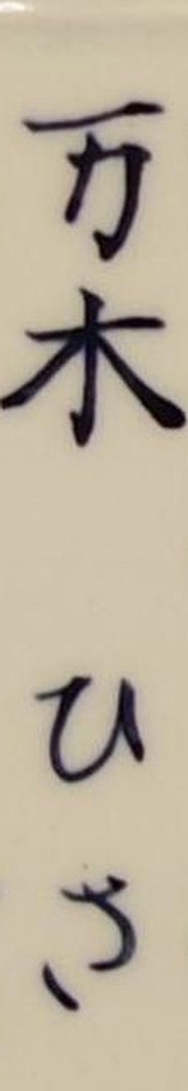万木ひさ
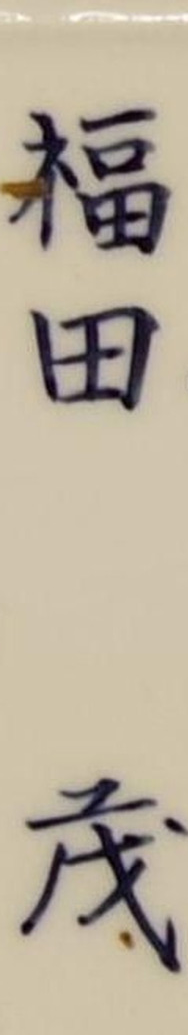福田茂
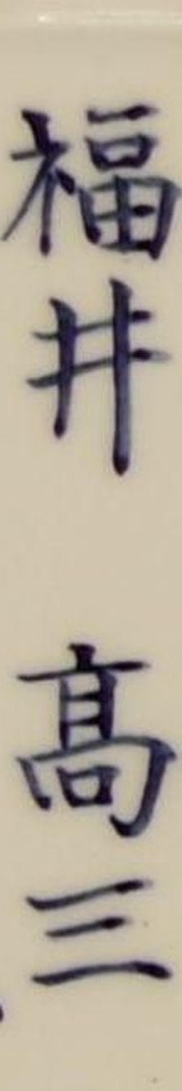福井高三
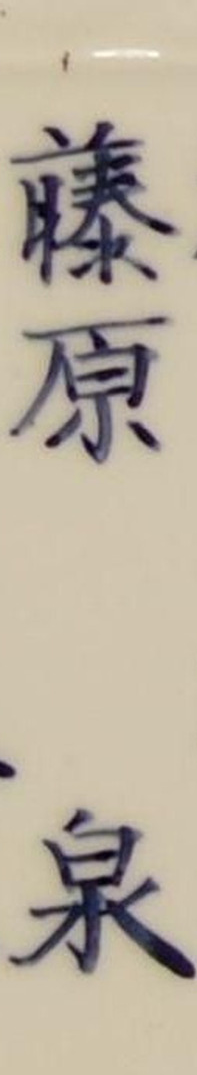藤原泉
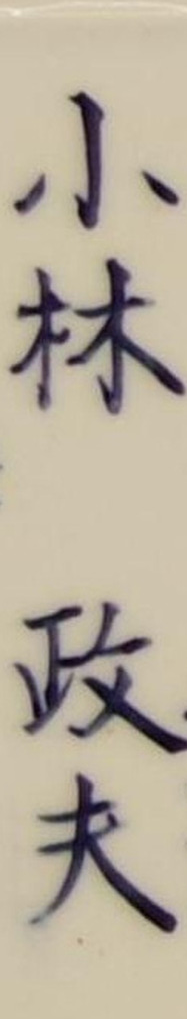小林政夫
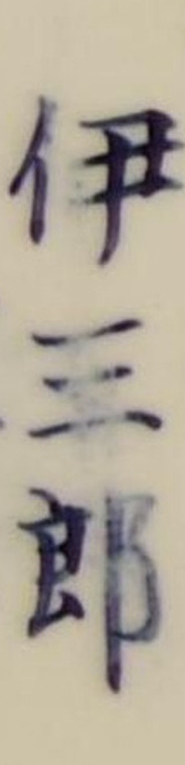伊三郎

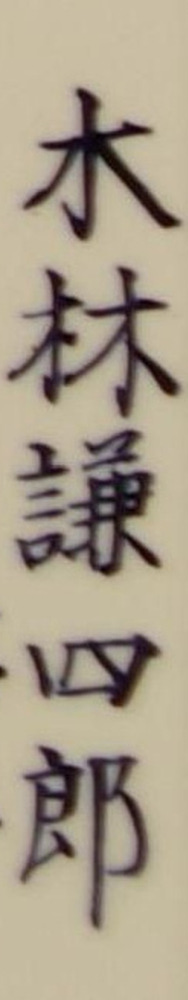木林謙四郎
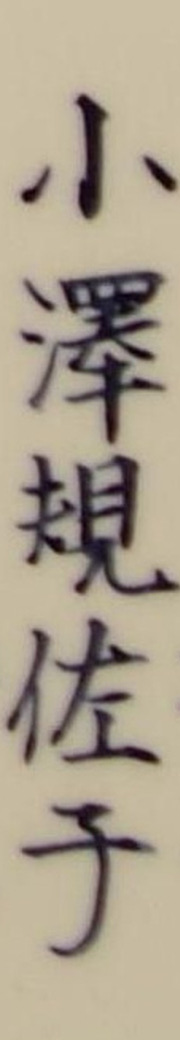小澤規佐子
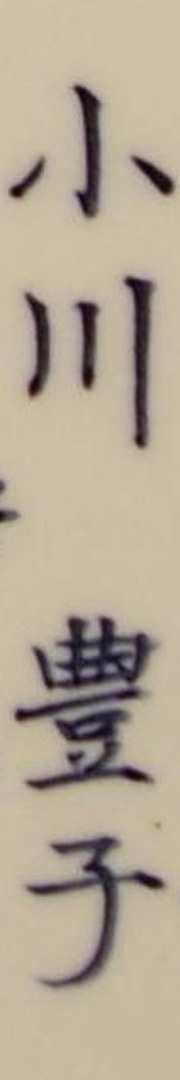小川豊子
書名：A~D
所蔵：koyasan kongobuji
